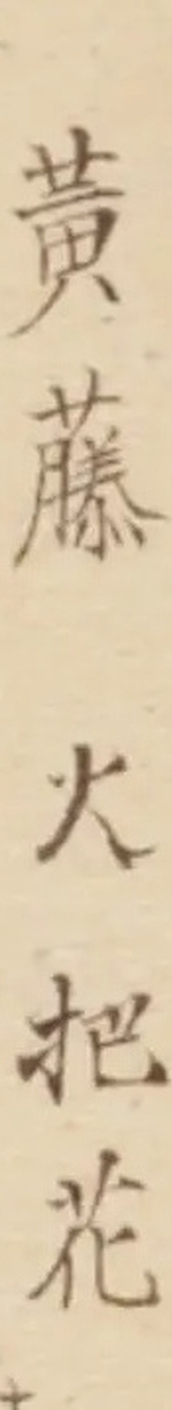黄藤大把花
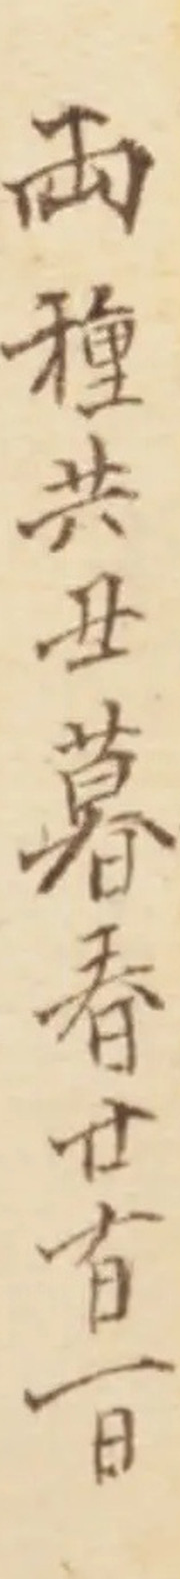両種共丑暮春廿有一日
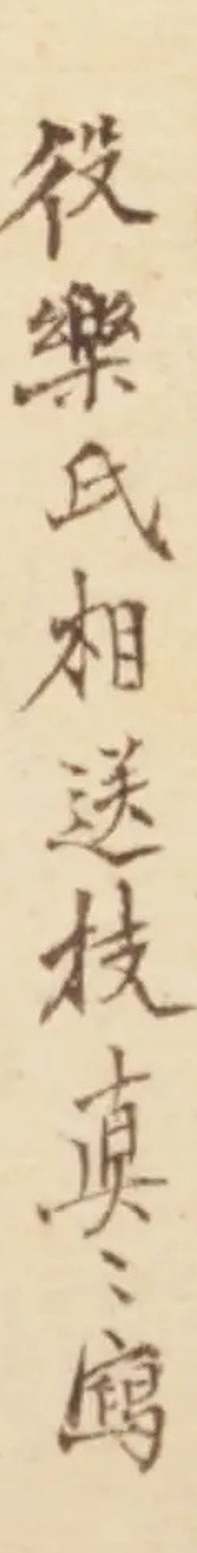役樂氏相送枝真寫

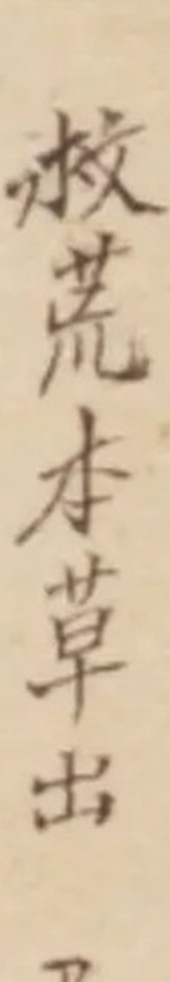救荒本草出
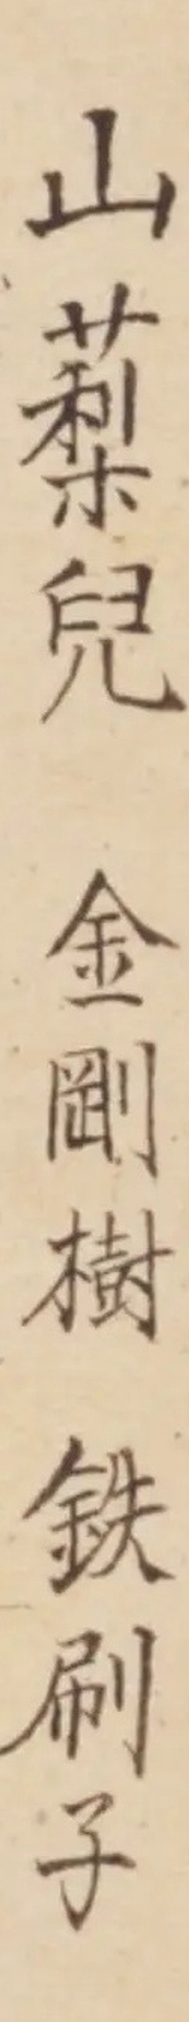山兒金剛樹鉄刷子
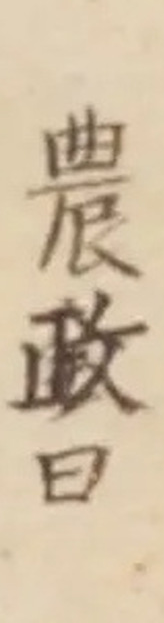農政曰
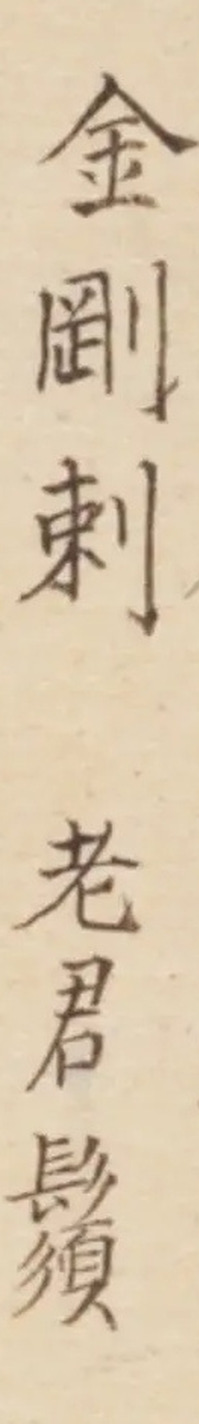金剛刺老君鬚
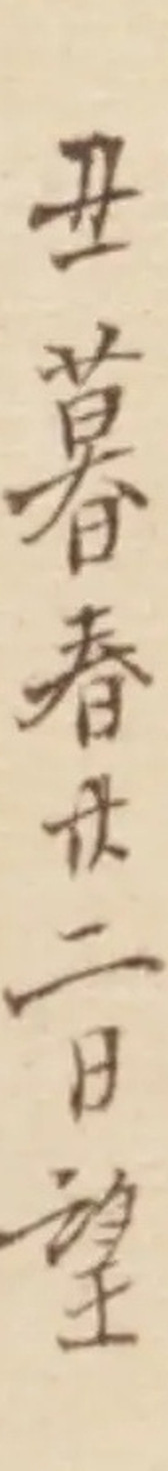丑暮春廿二日望
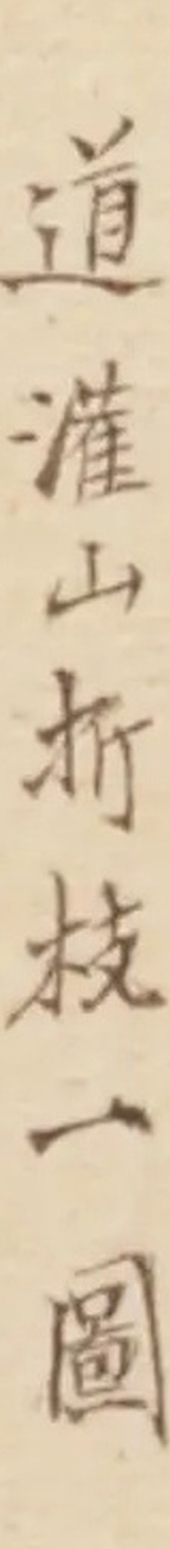道潅山折枝一圖
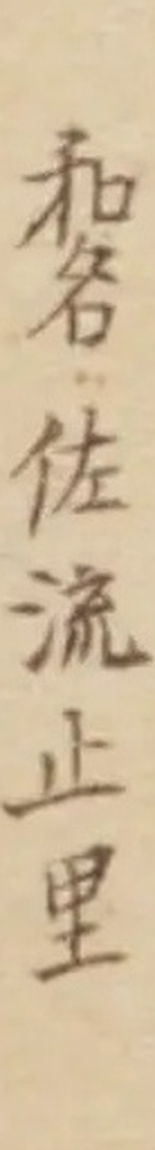和名佐流止里
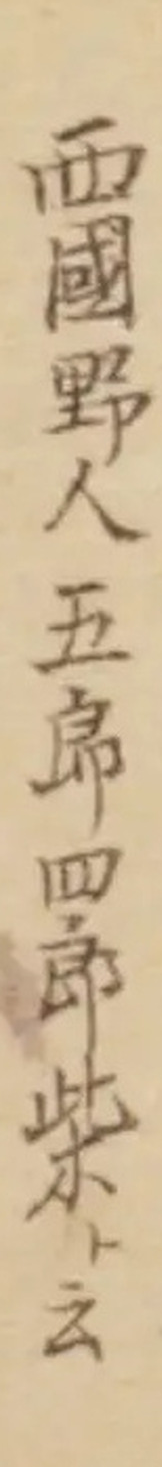西國野人五郎四郎柴と云

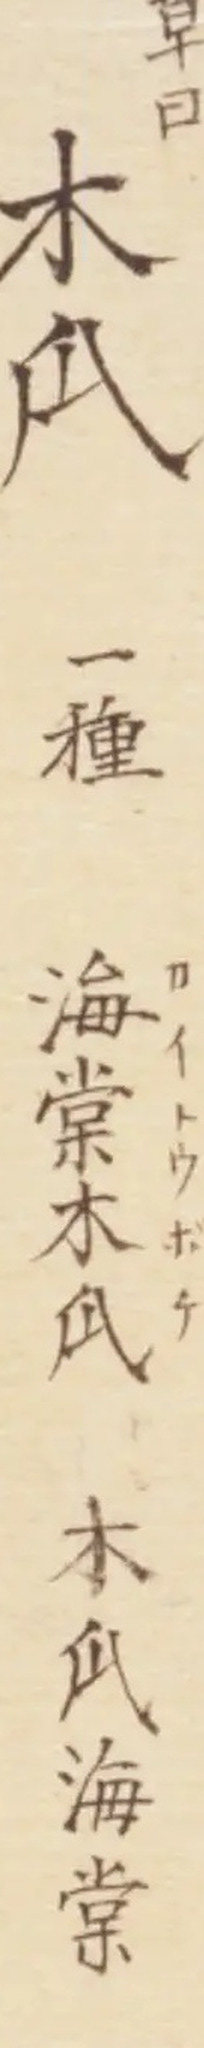木瓜一種海棠木瓜木瓜海棠
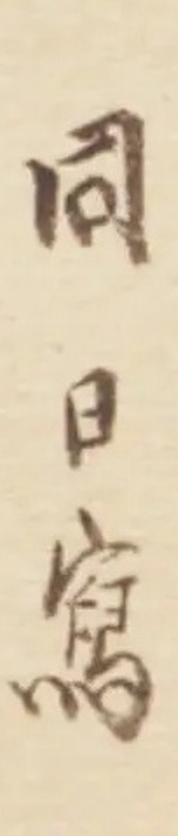同日寫

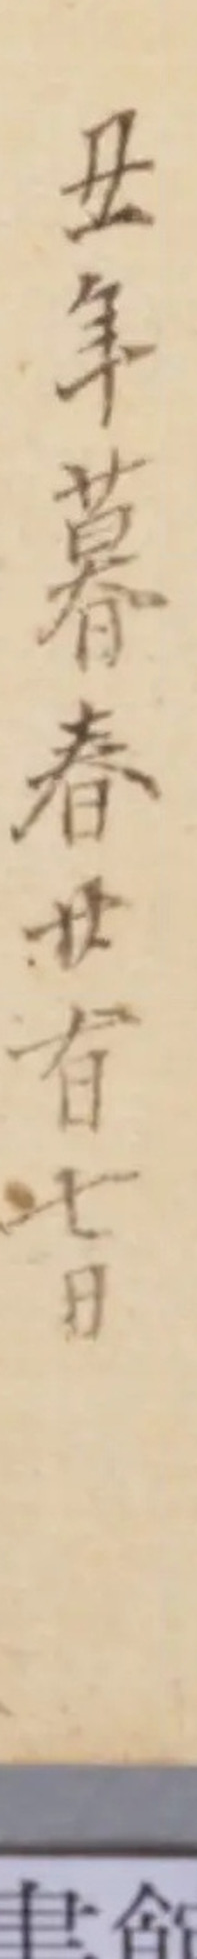丑年暮春廿有七日
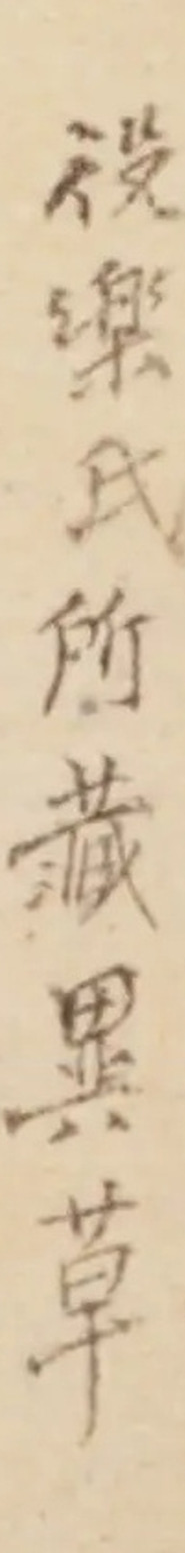設楽氏所蔵異草
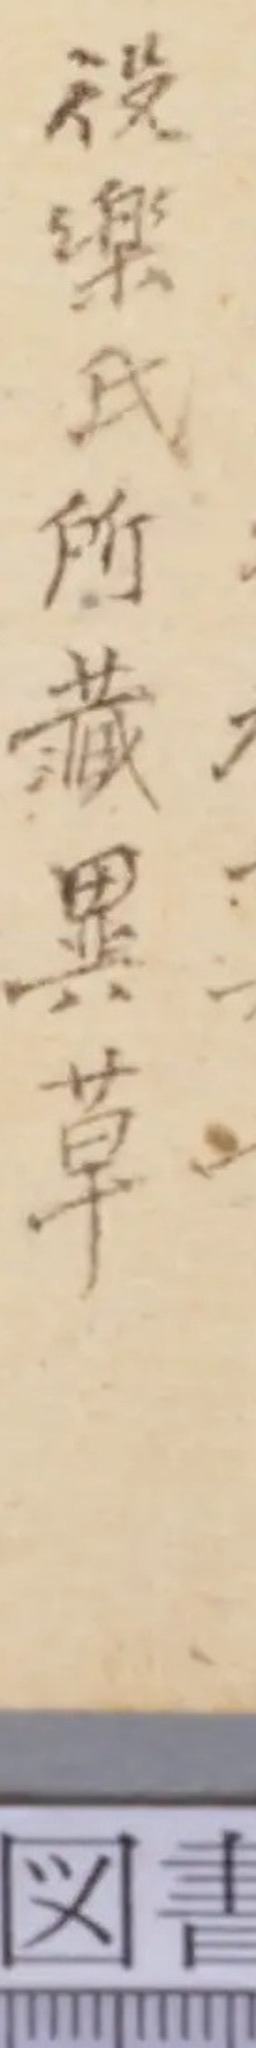設楽氏所蔵異草
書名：梅園草木花譜春之部. 4
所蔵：国立国会図書館 National Diet Library, JAPAN
